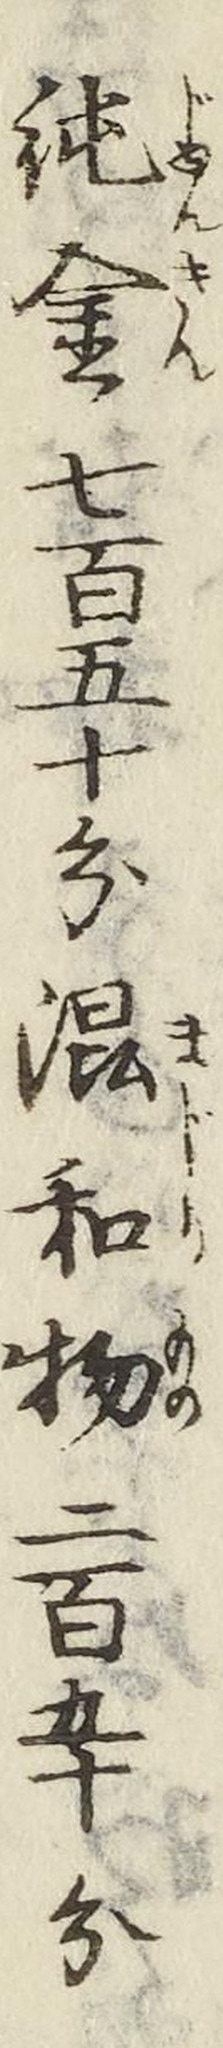純金七百五十分混和物二百五十分
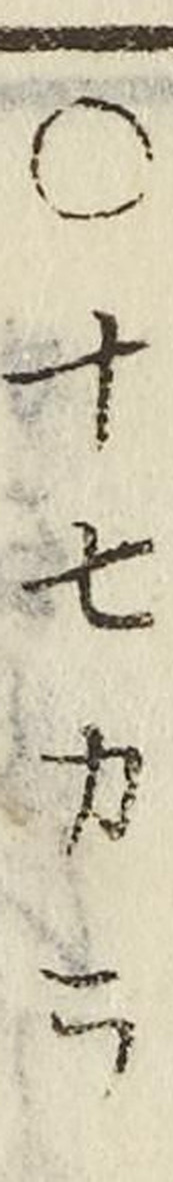○十七カラ
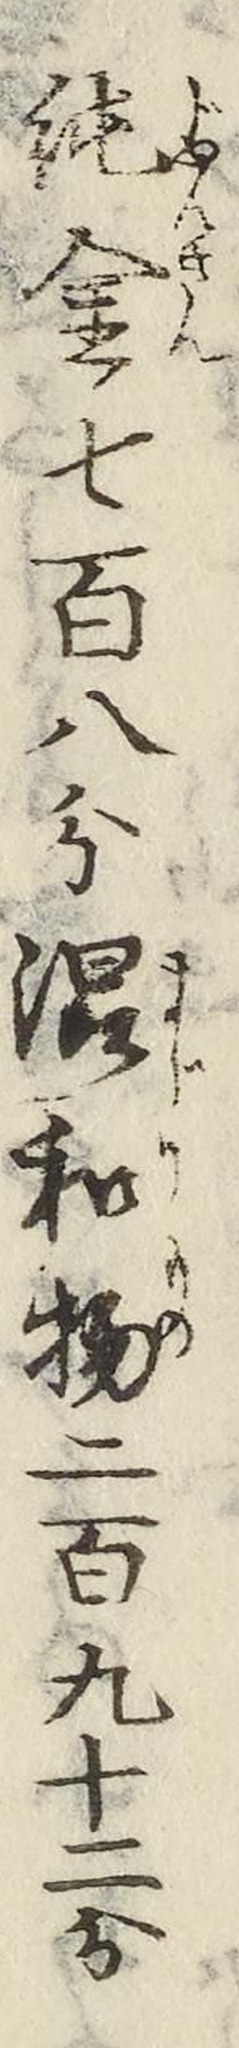純金七百八分混和物二百九十二分
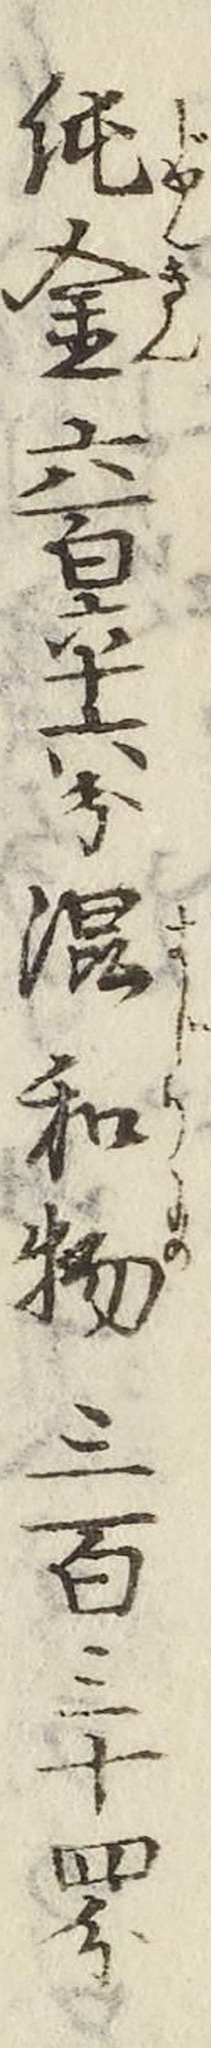純金六百六十六分混和物三百三十四分
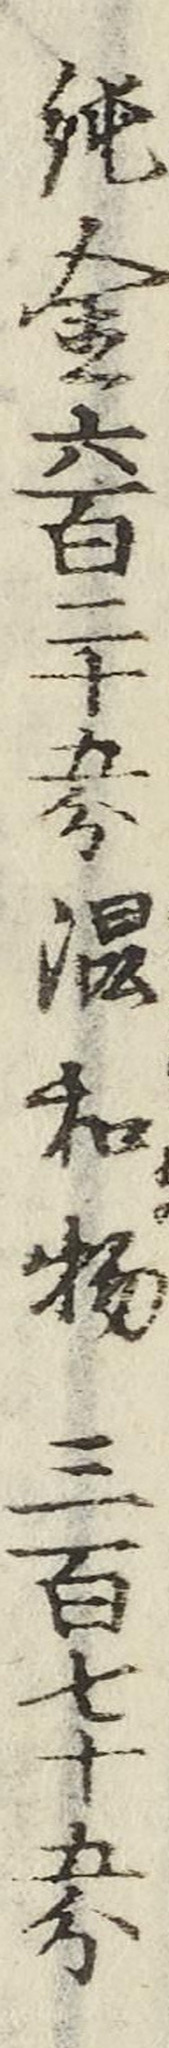純金六百二十五分混和物三百七十五分
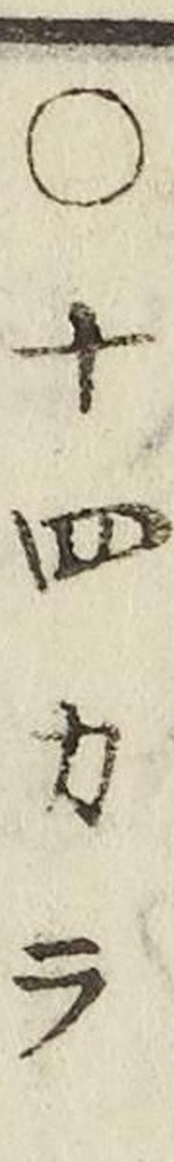○十四カラ
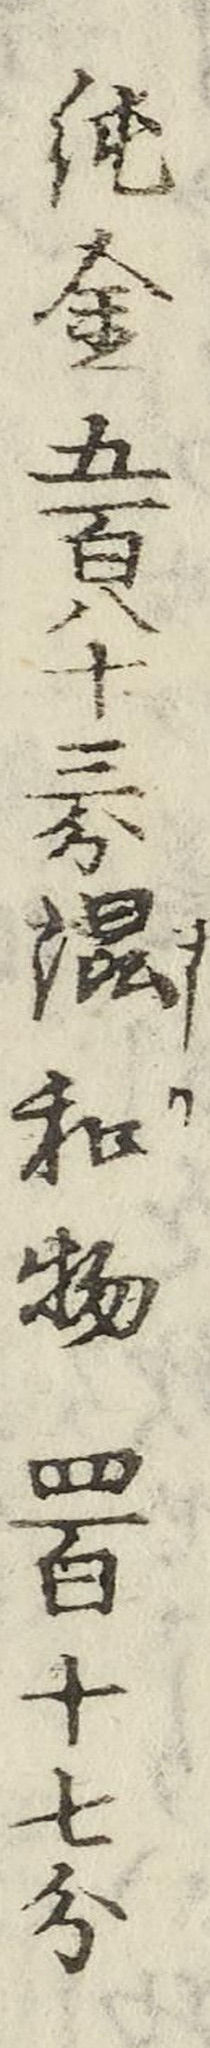純金五百八十三分混和物四百十七分
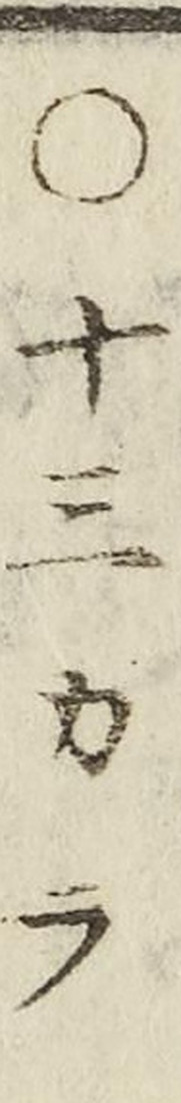○十三カラ
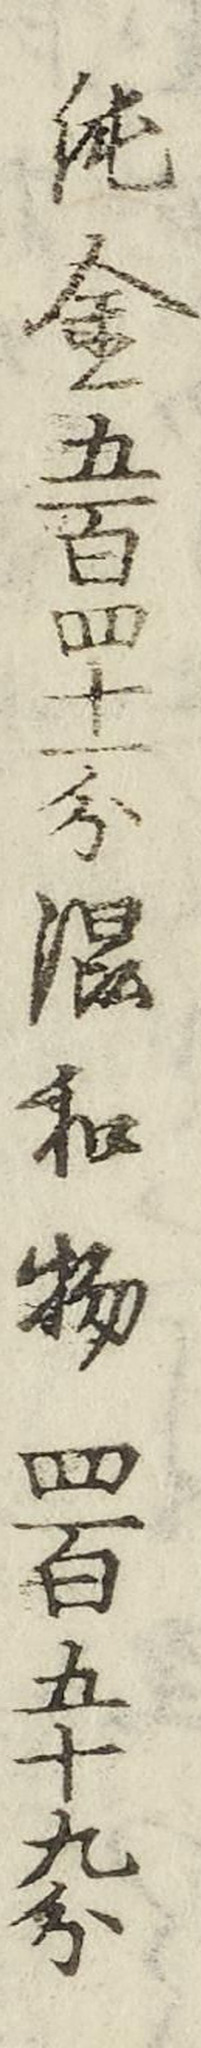純金五百四十一分混和物四百五十九分
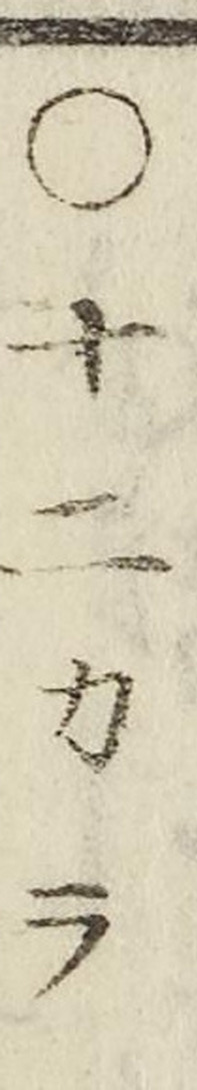○十二カラ
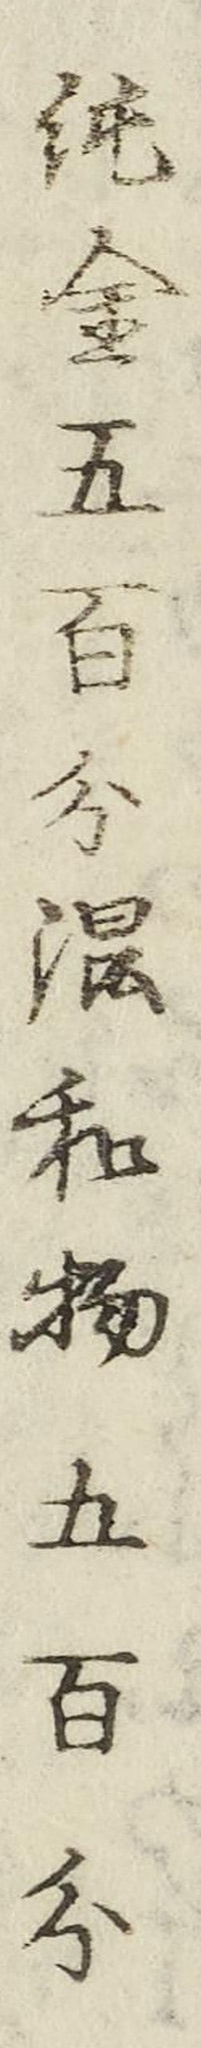純金五百分混和物五百分
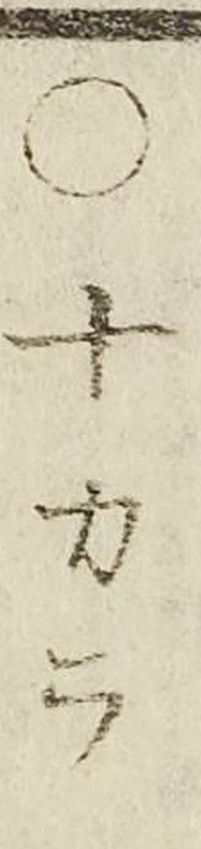○十カラ
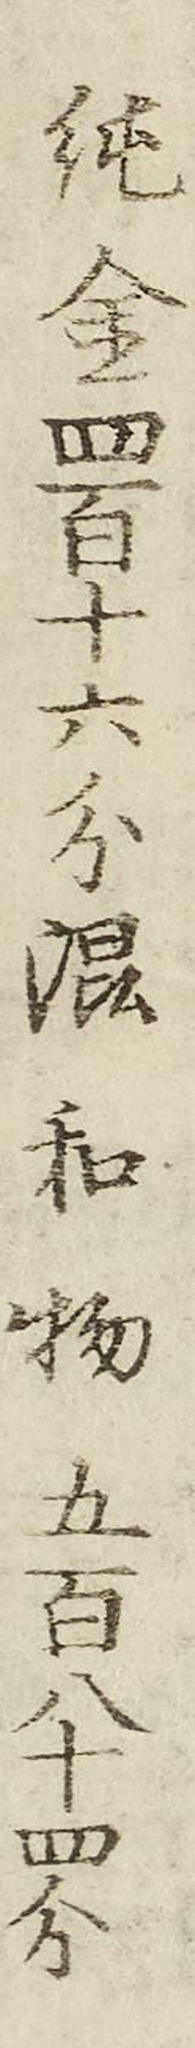純金四百十六分混和物五百八十四分
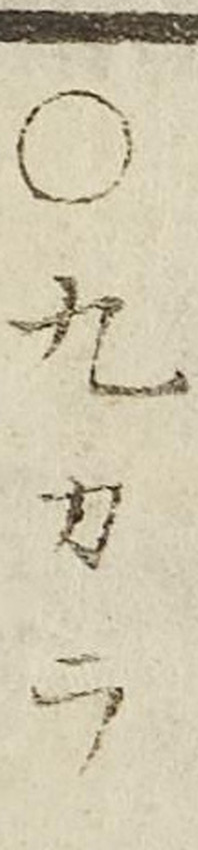○九カラ

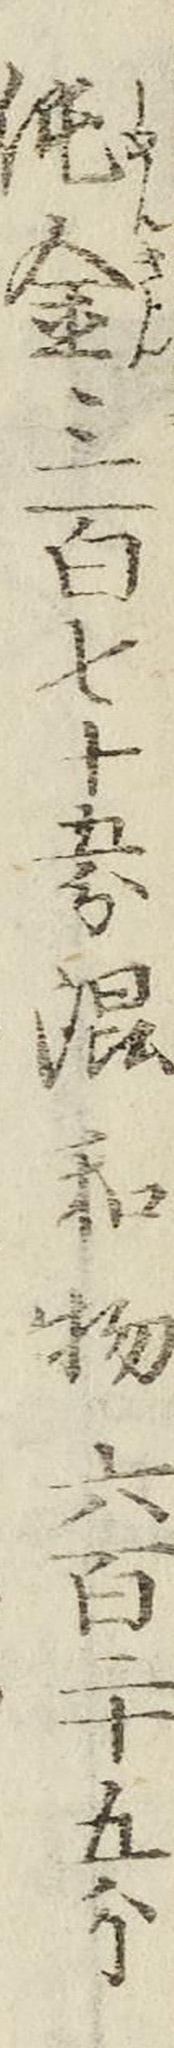純金三百七十五分混和物六百二十五分
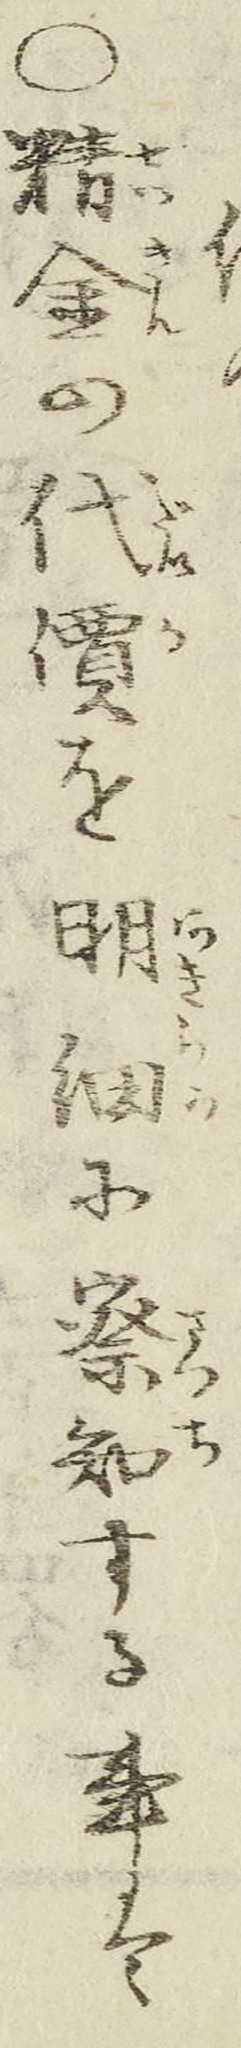○精金の代価を明細に察知する事は
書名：[時計に関する冊子]
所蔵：東京大学地震研究所図書室 Earthquake Research Institute Library, The University of Tokyo, JAPAN
